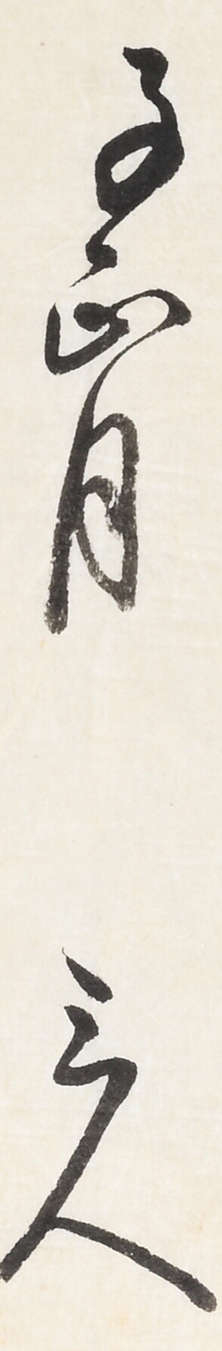子正月三人
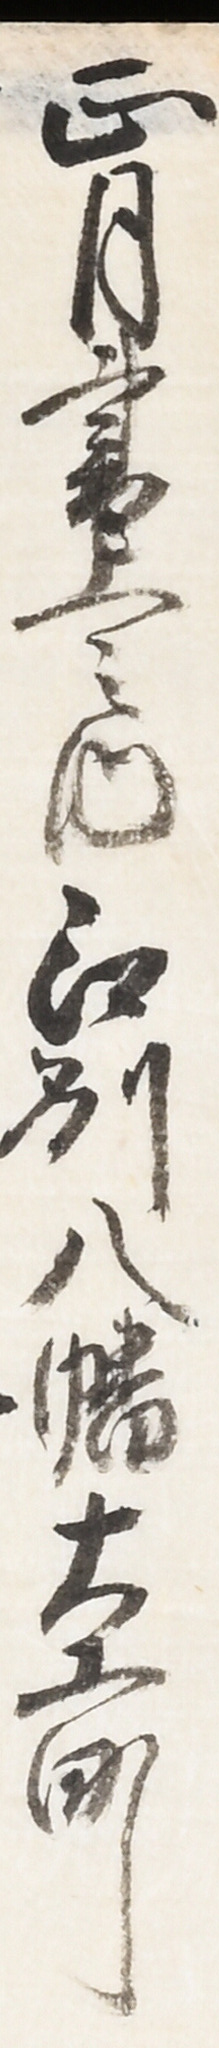正月書上之内江州八幡大工町
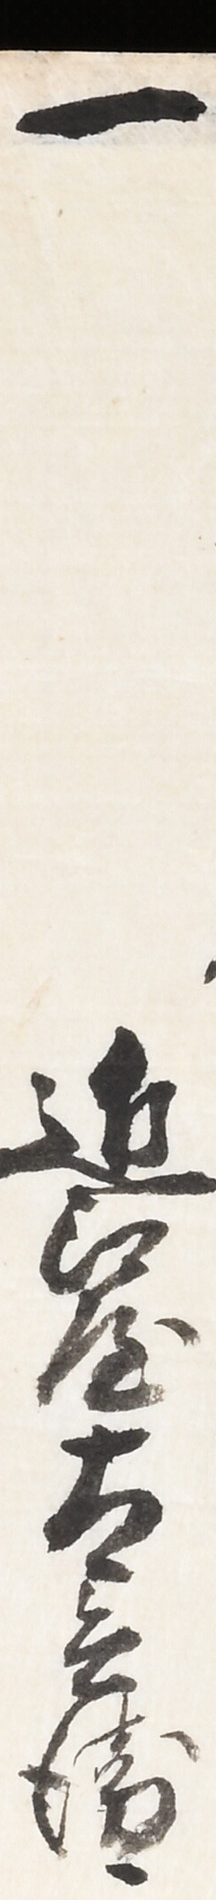一近江屋太兵衛・
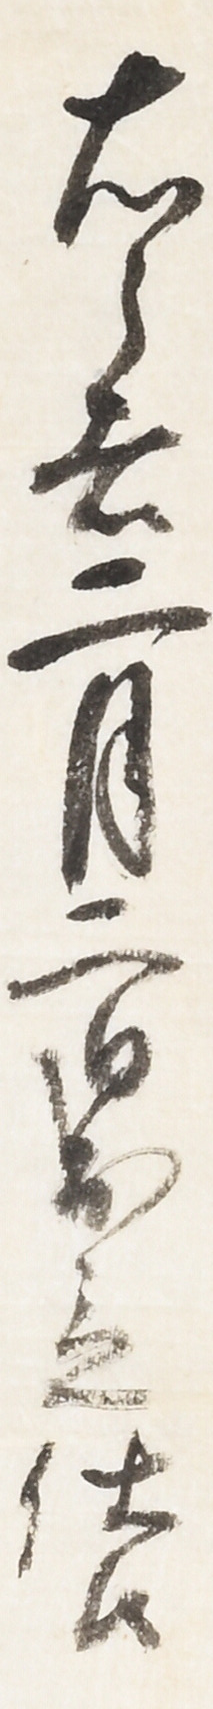右之者二月二日出立仕候
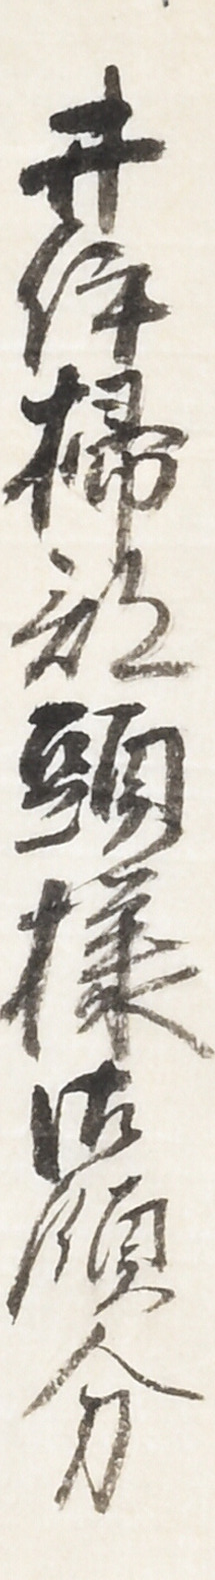井伊掃部頭様御領分
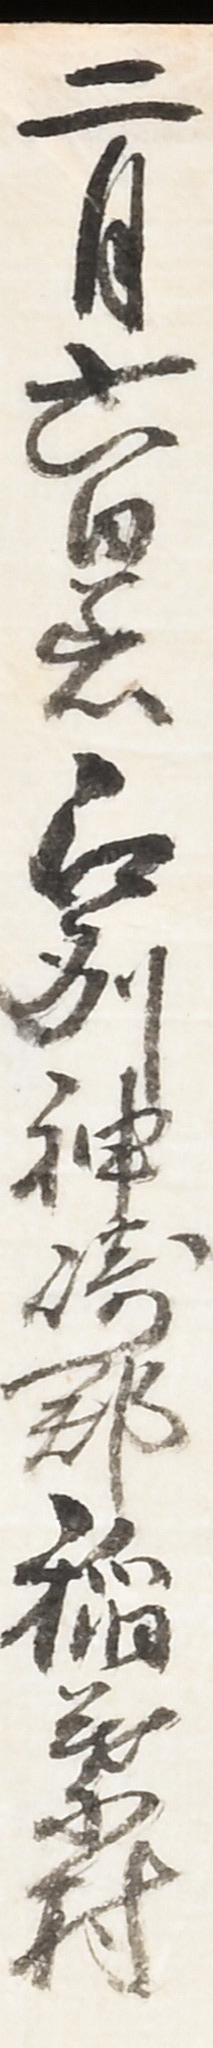二月六日着江州神崎郡稲葉村
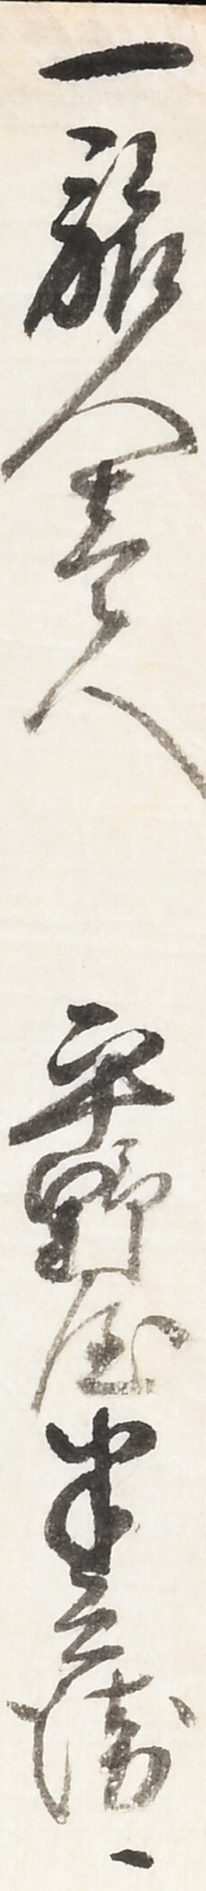一旅人壱人平野屋半兵衛・
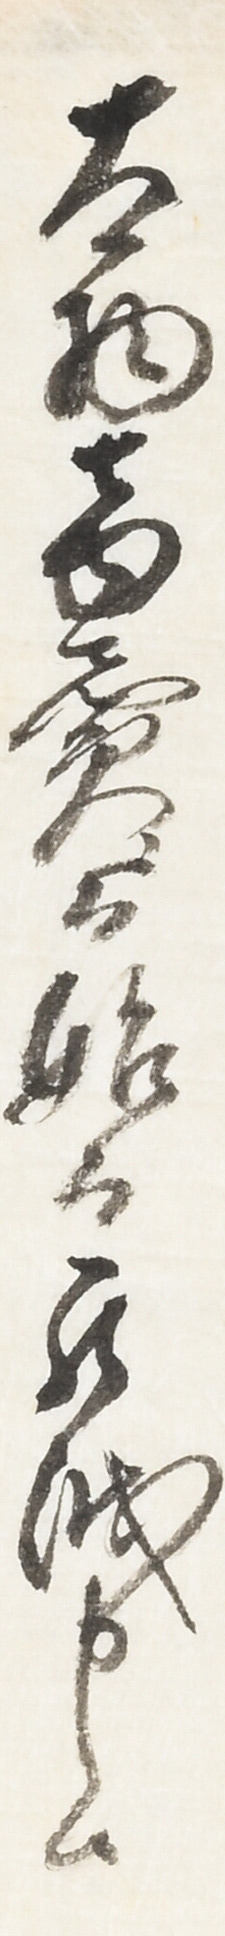太物商売ニ而始而罷越申候
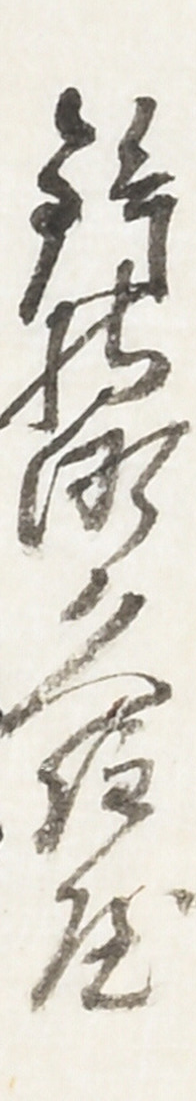鉾持町久住屋
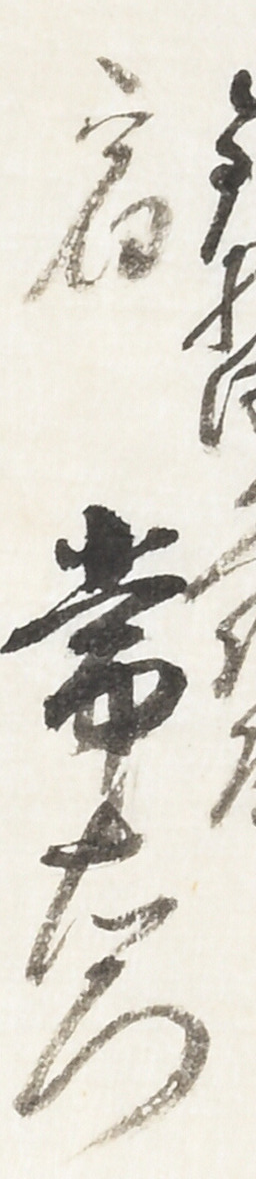宿常右衛門
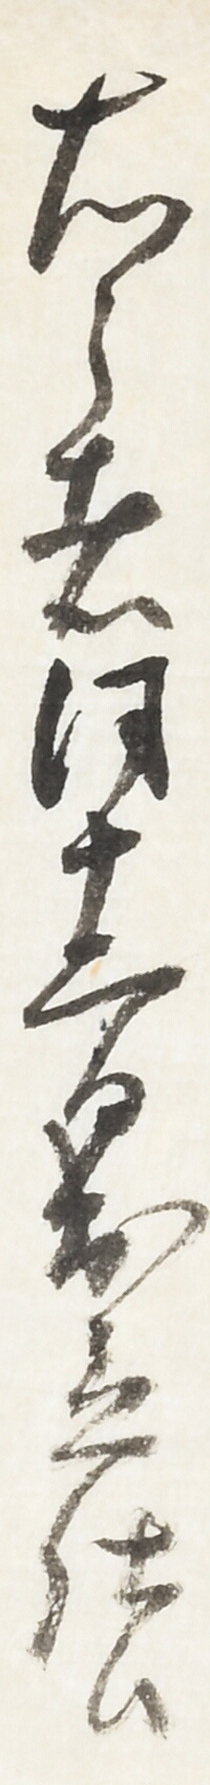右之者同十二日出立仕候
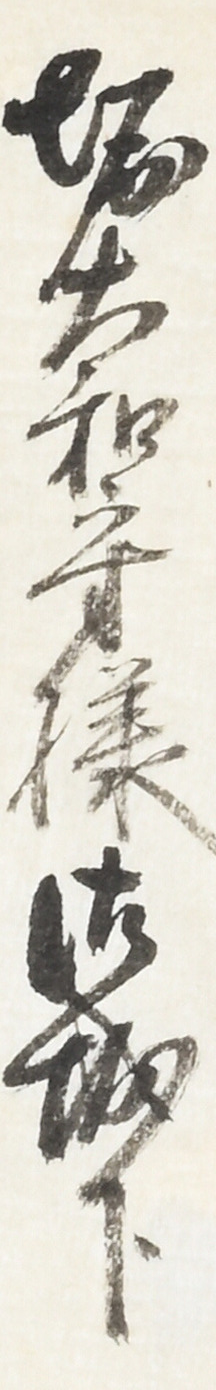堀大和守様御城下
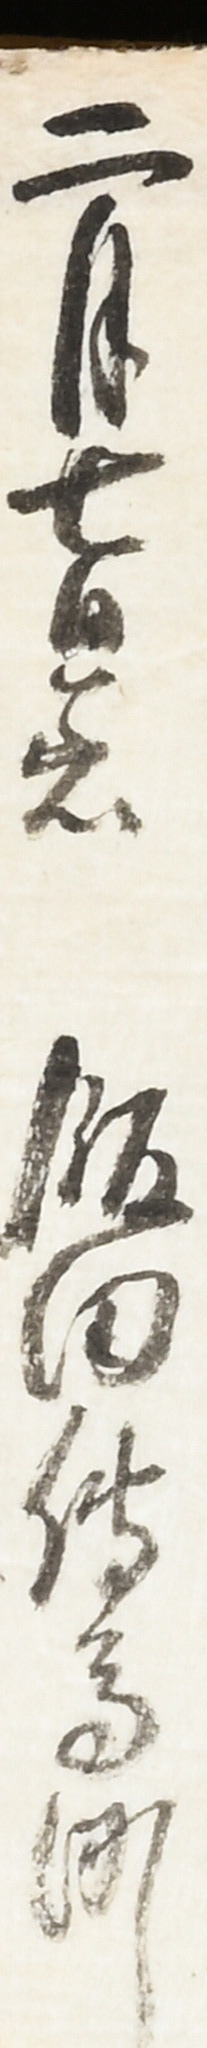二月七日着飯田伝馬町
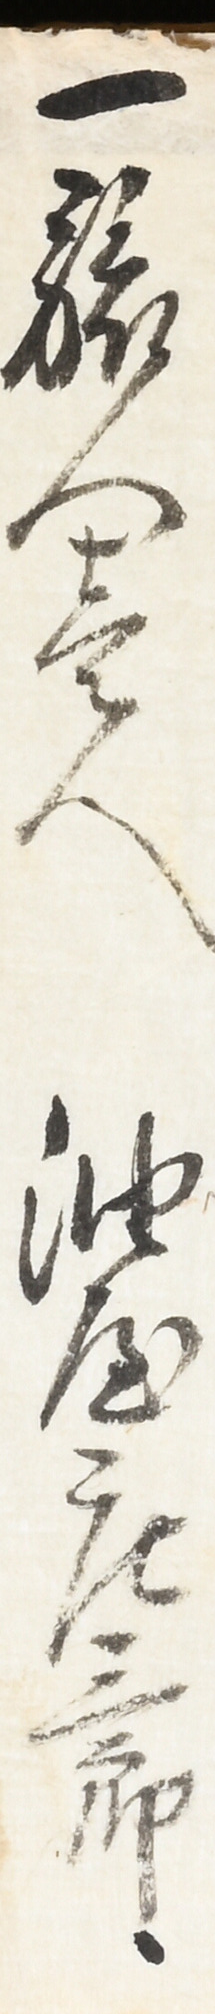一旅人壱人油屋庄三郎・
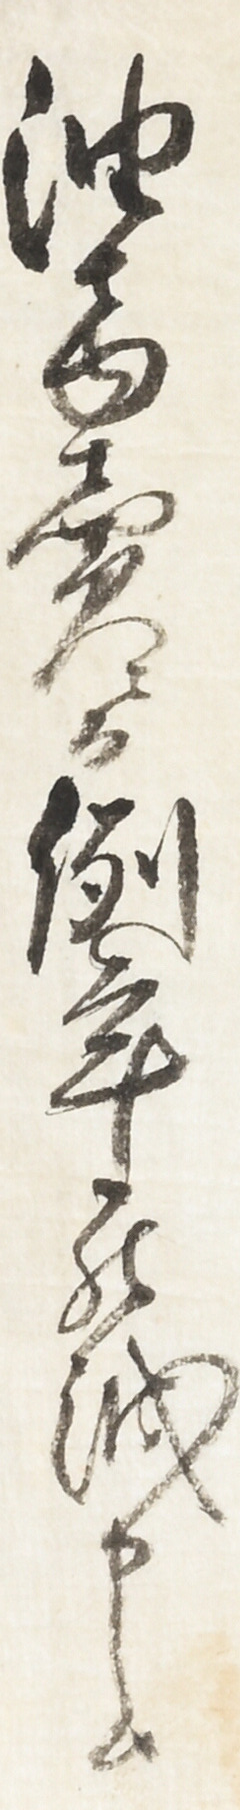油商売ニ而例年罷越申候

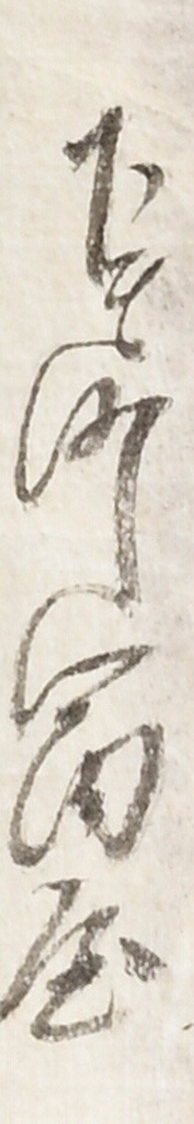下モ町冨屋
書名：旅人泊控帳
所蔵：伊那市立高遠町図書館・合同会社AMANE
